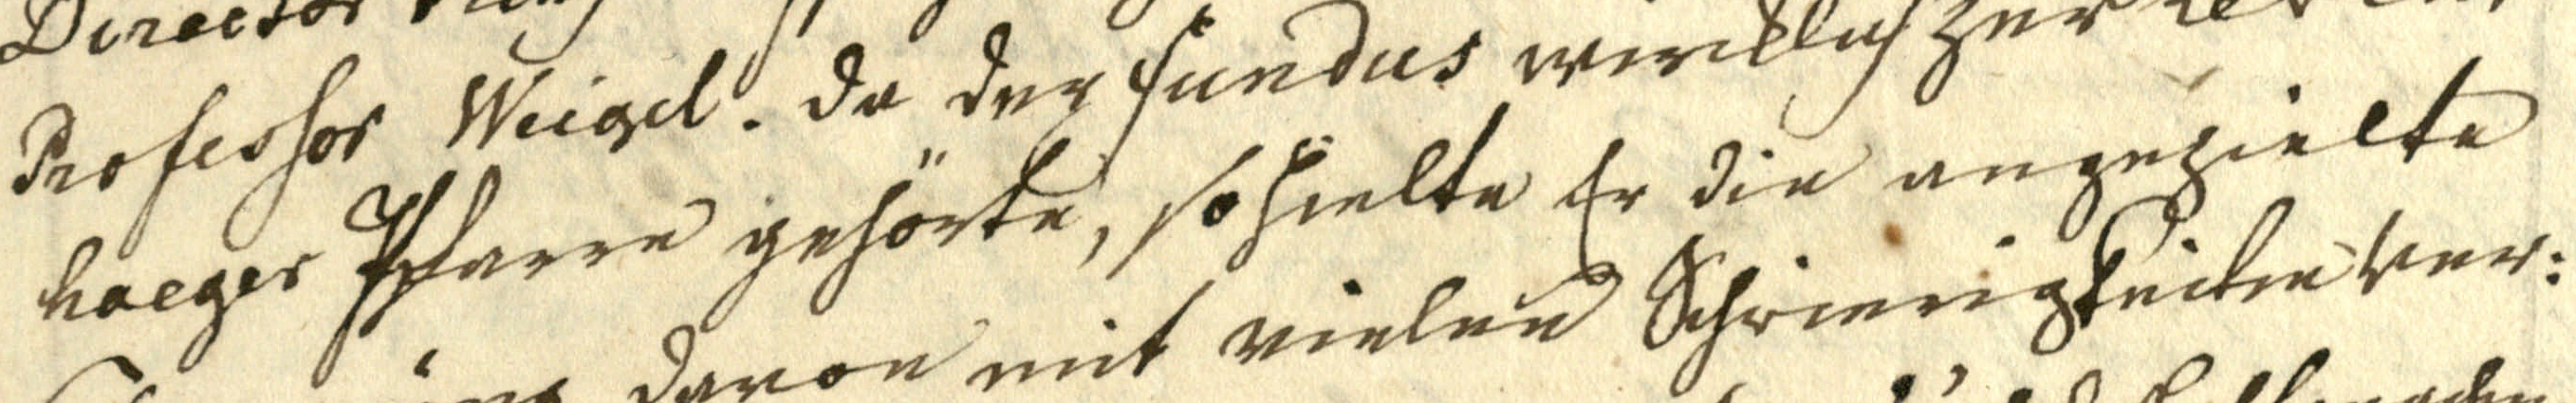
haeger Pfarre gehörte, so hielte Er die angezielte
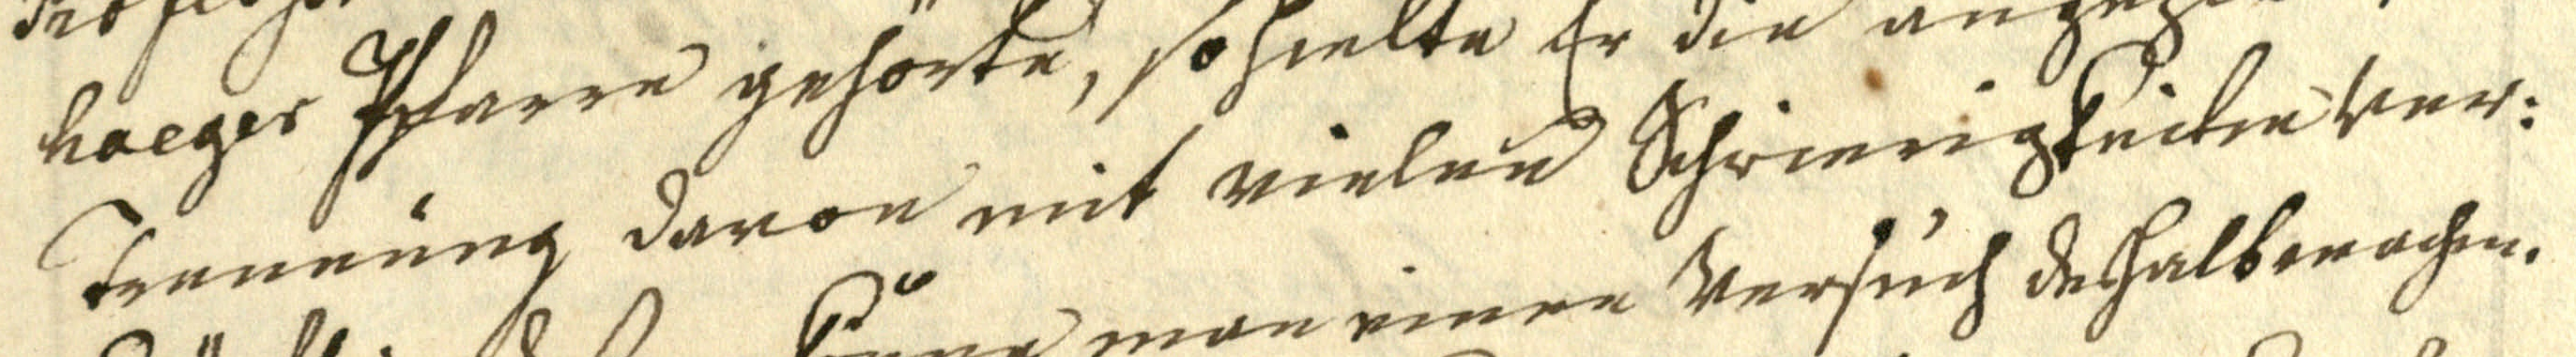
Trennung davon mit vielen Schwierigkeiten ver¬
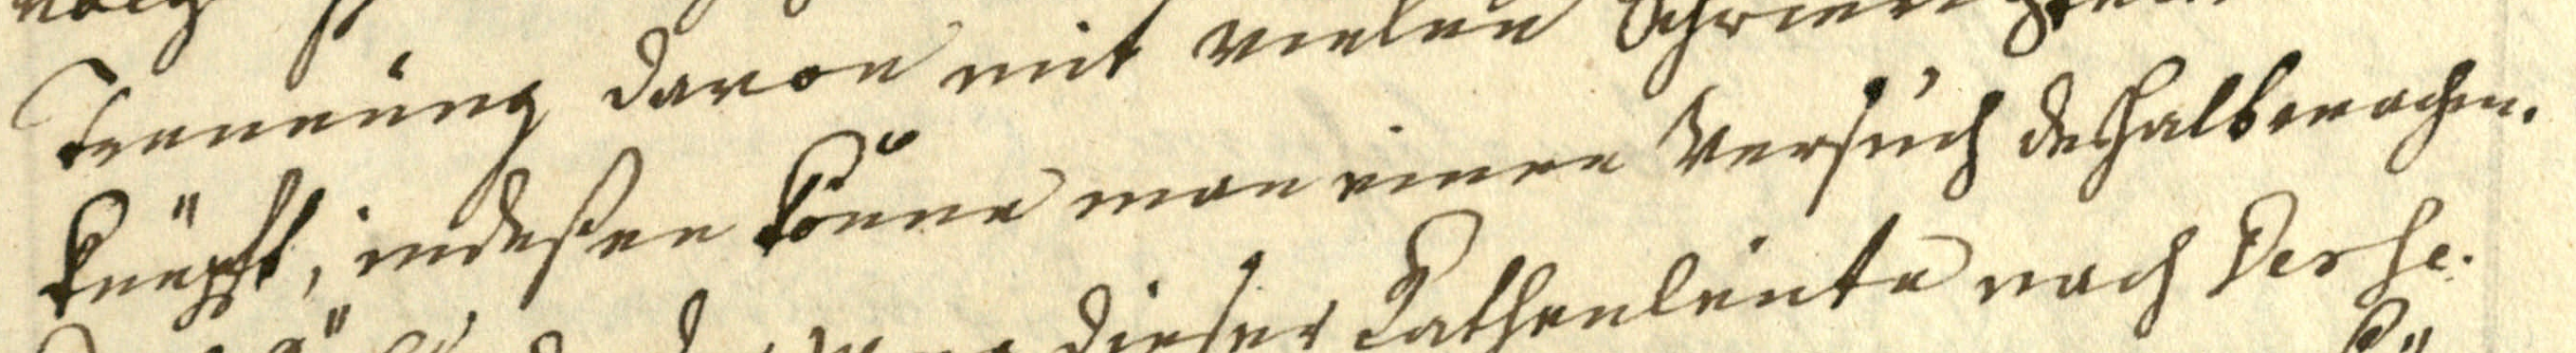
knüpft, indeßen könne man einen Versuch deshalb machen.
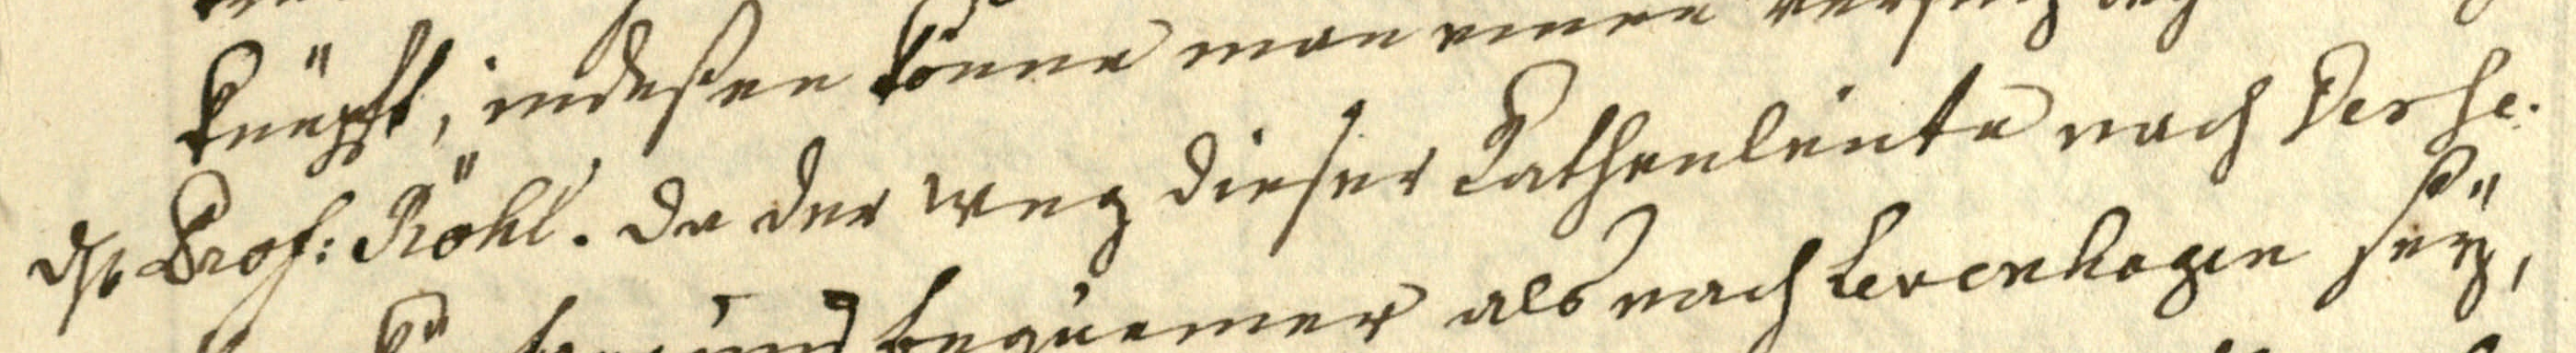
dh Prof. Röhl. Da der Weg dieser Kathenleute nach Derse¬
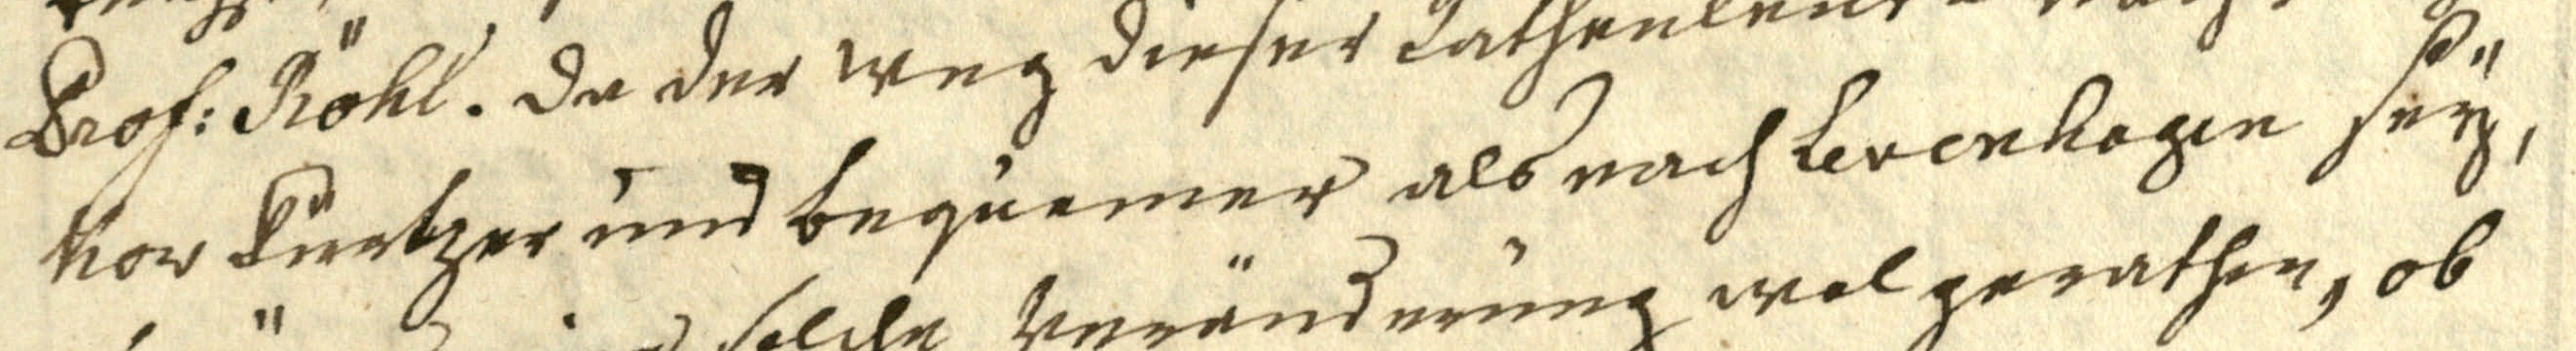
kow kürtzer und bequemer als nach Levenhagen seÿ,
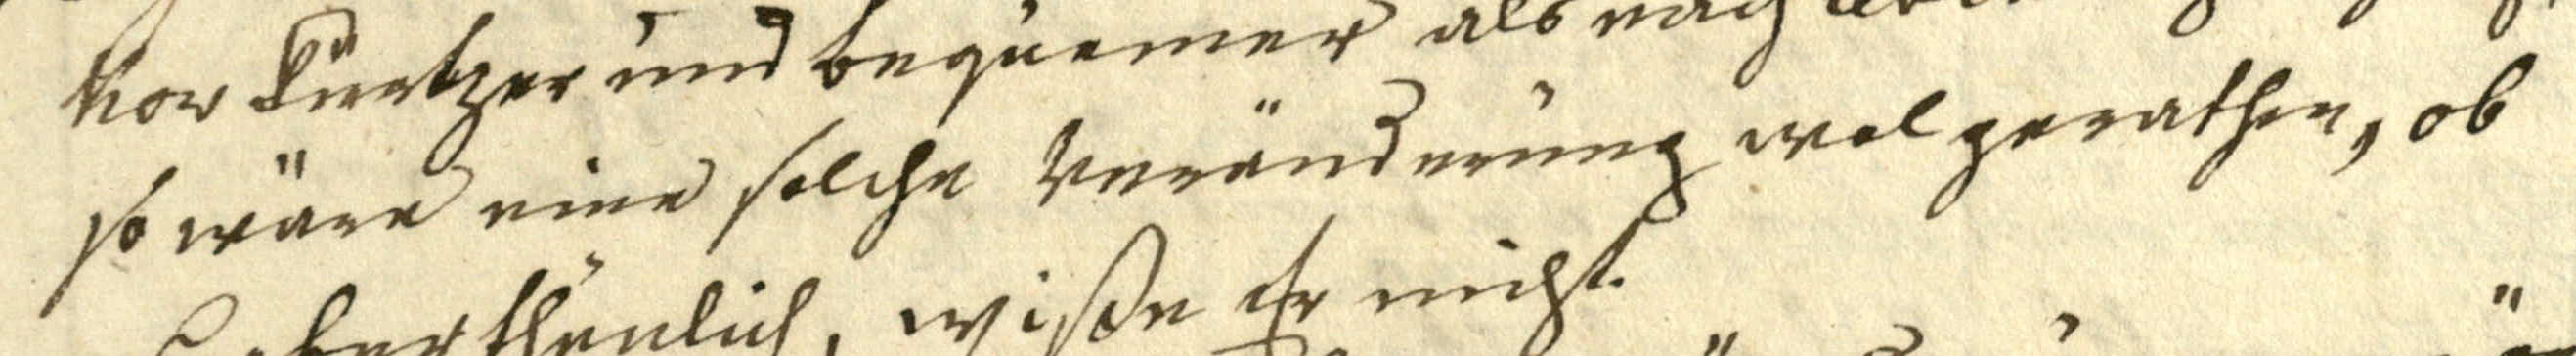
so wäre eine solche Veränderung wol gerathen, ob
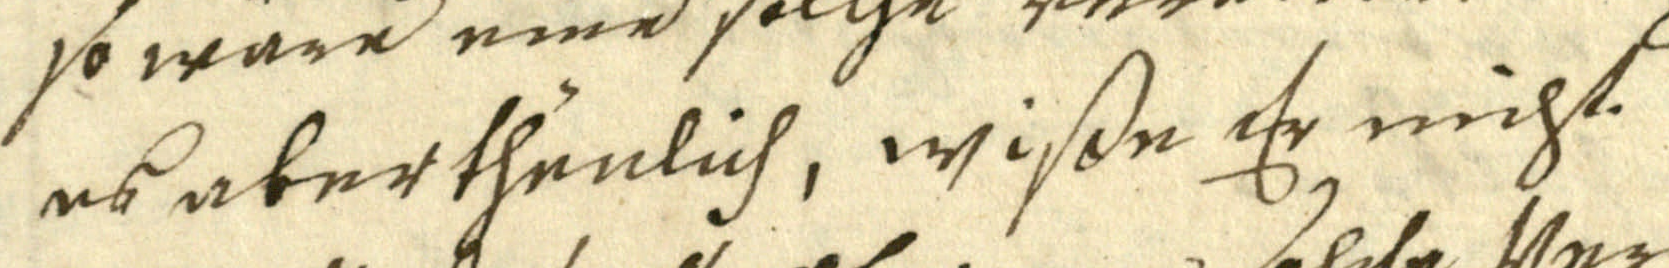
es aber thunlich, wiße Er nicht.
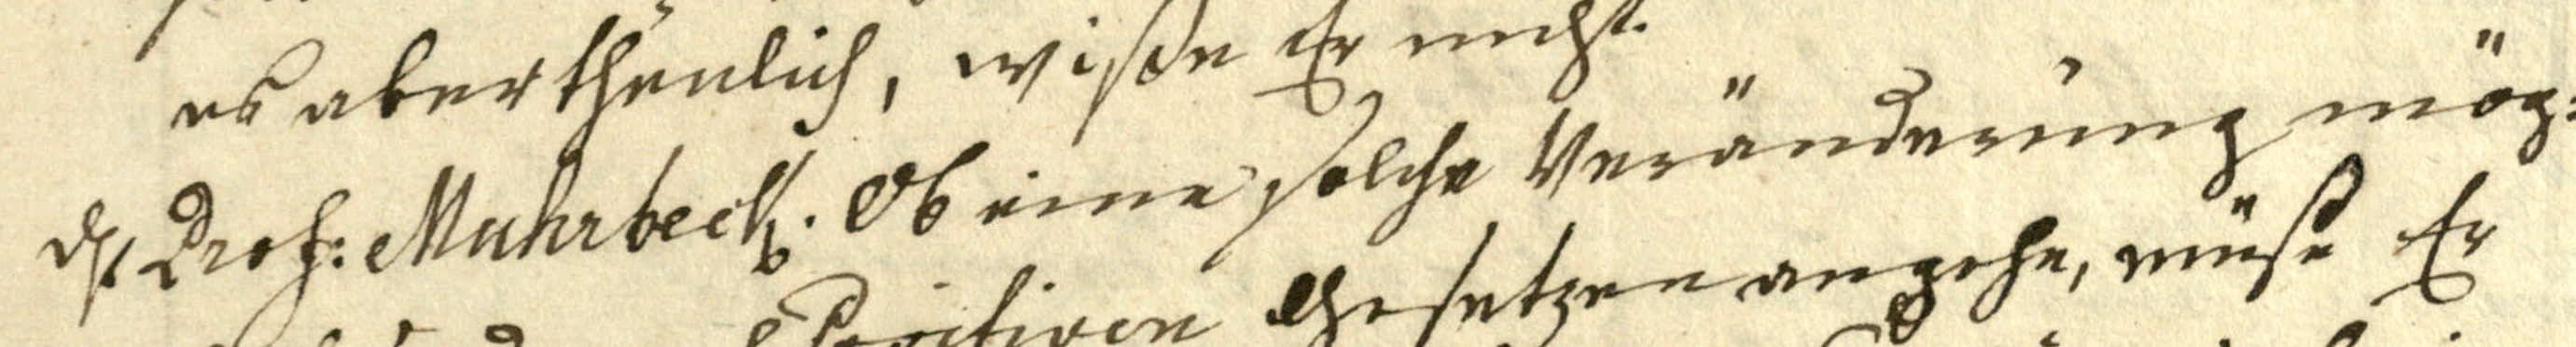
dh. Prof. Muhrbeck. Ob eine solche Veränderung mög¬
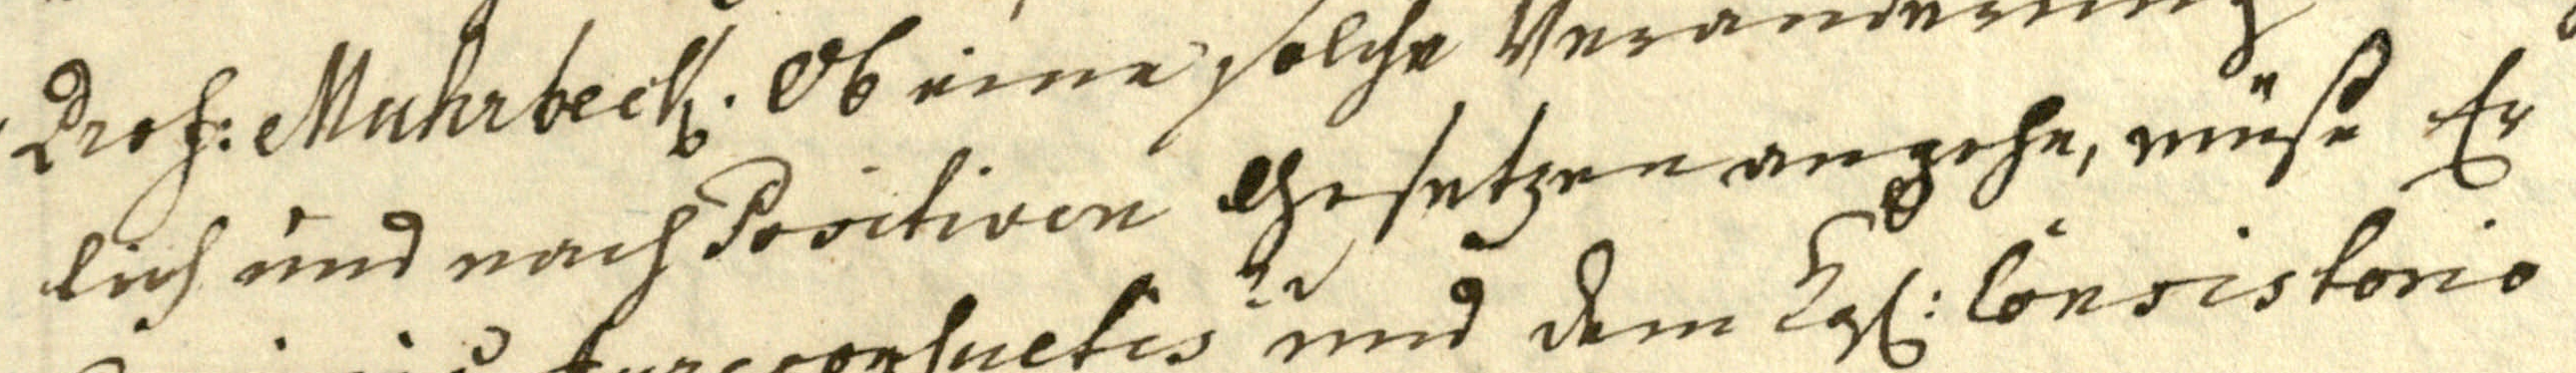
lich und nach Positiven Gesetzen angehe, müße Er
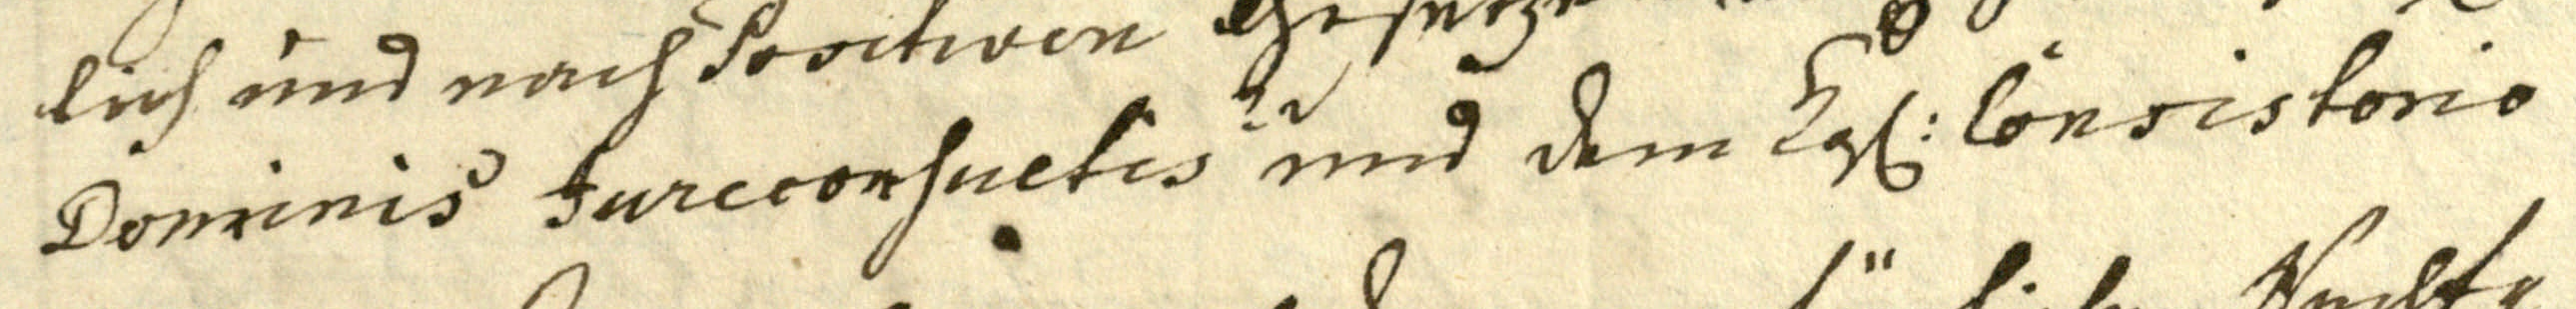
Dominis Jureconsultis und dem Kgl. Consistorio
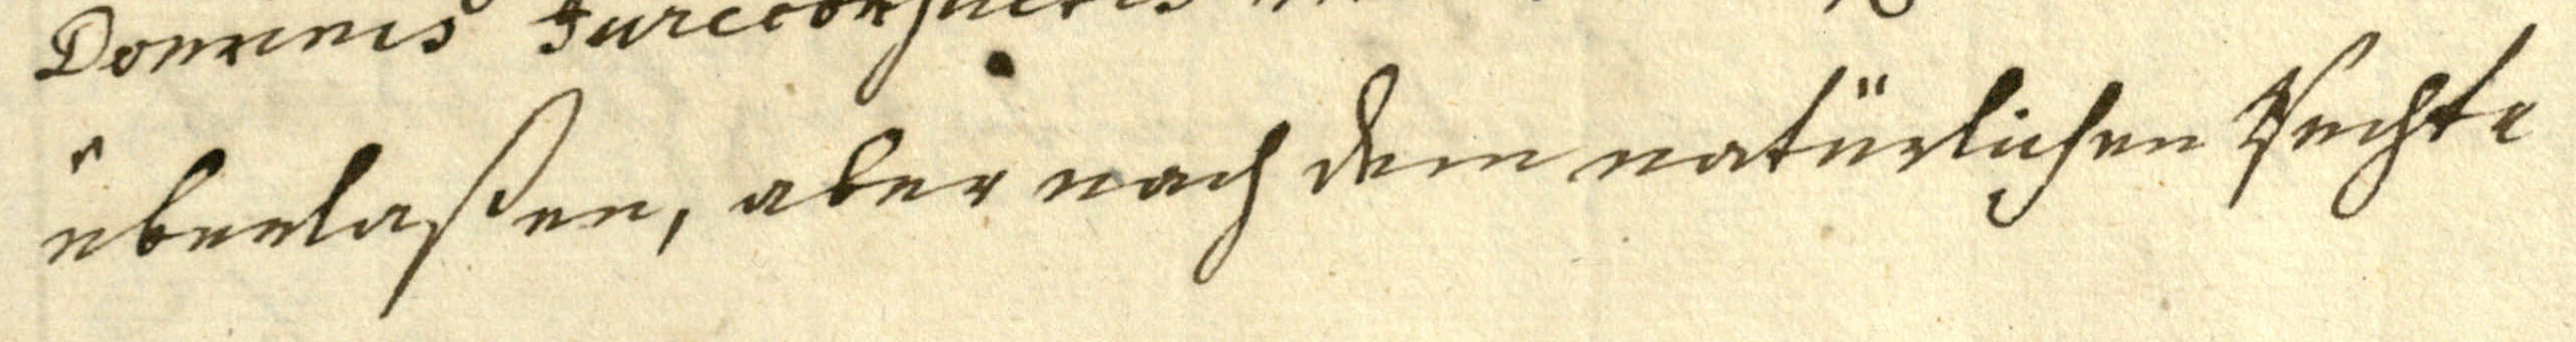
überlaßen, aber nach dem natürlichen Rechte
